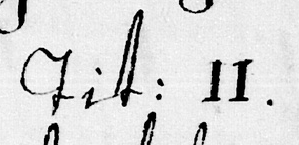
Tit. II.
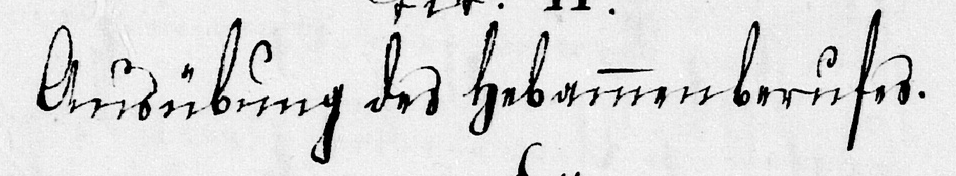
Ausübung des Hebammenberufes.
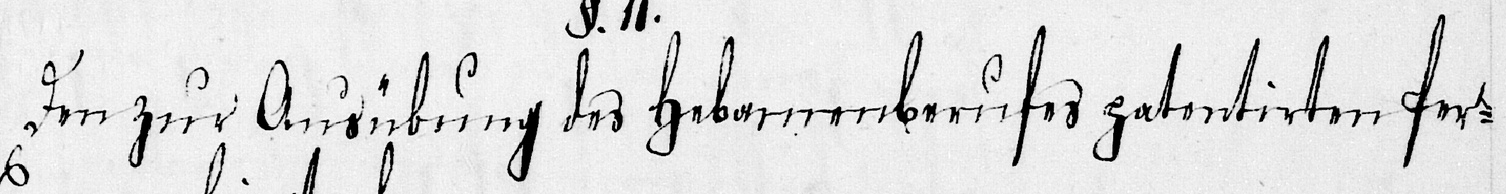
Den zur Ausübung des Hebammenberufes patentirten Per¬
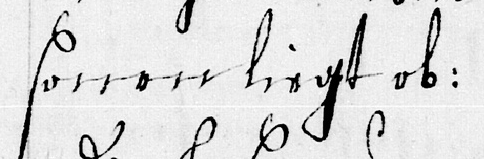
sonen liegt ob:
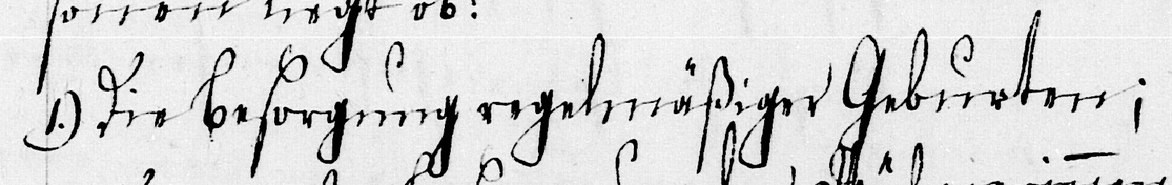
1.) Die Besorgung regelmäßiger Geburten;
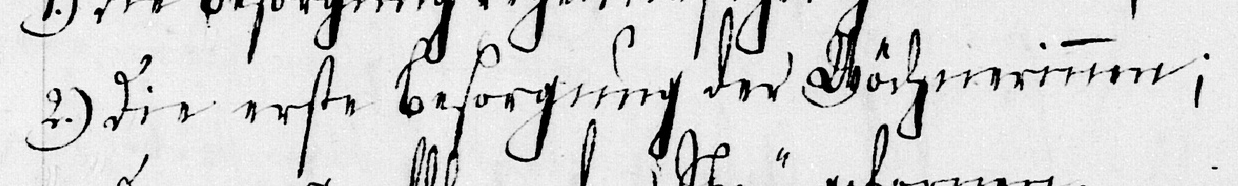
2.) Die erste Besorgung der Wöchnerinnen;
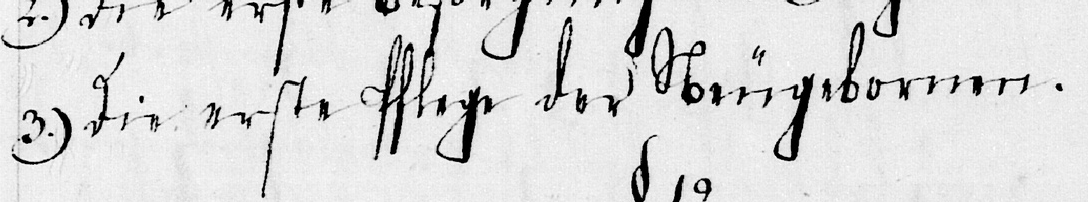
3.) Die erste Pflege der Neugeborenen.
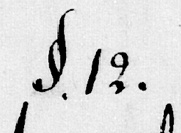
§. 12.
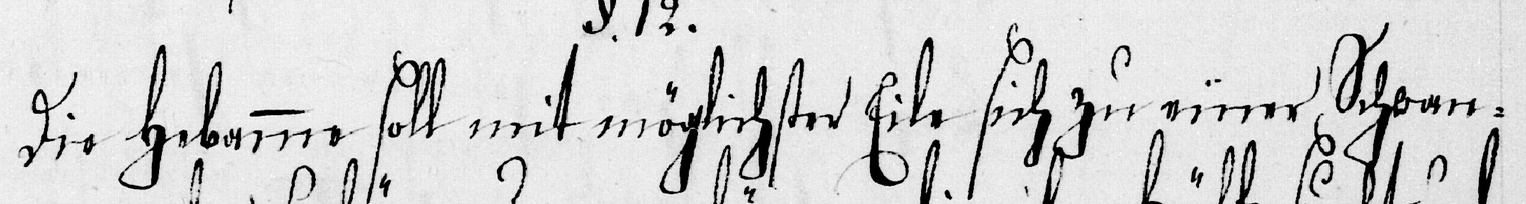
Die Hebamme soll mit möglichster Eile sich zu einer Schwan¬
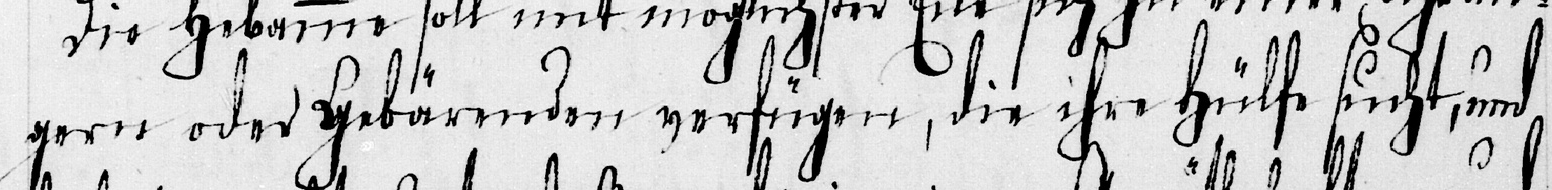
gern oder Gebärenden verfügen, die ihre Hülfe sucht, und
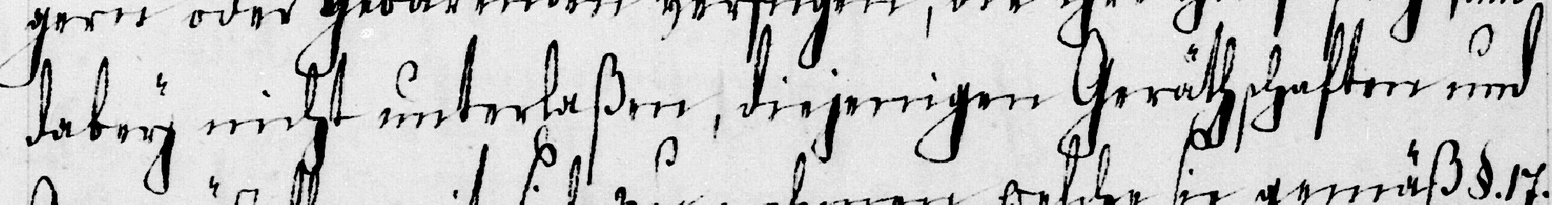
dabey nicht unterlaßen, diejenigen Geräthschaften und
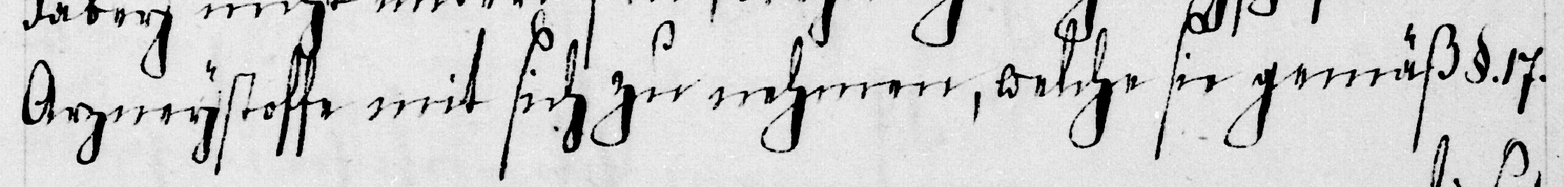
Arzneystoffe mit sich zu nehmen, welche sie gemäß §.17.
